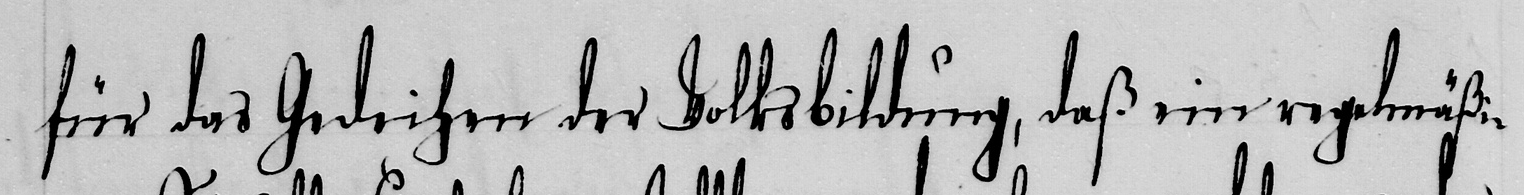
für das Gedeihen der Volksbildung, daß ein regelmäß¬
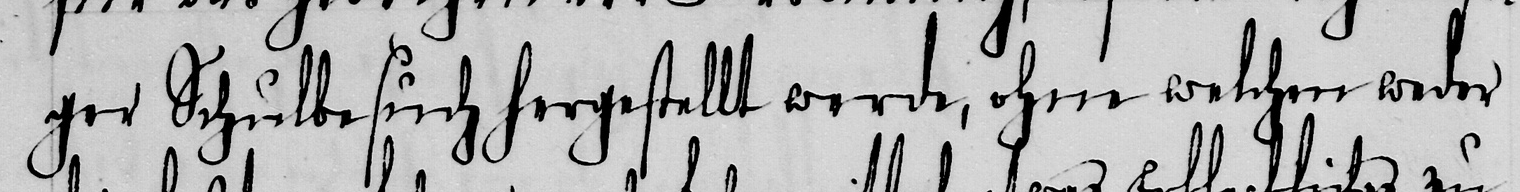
iger Schulbesuch hergestellt werde, ohne welchen weder
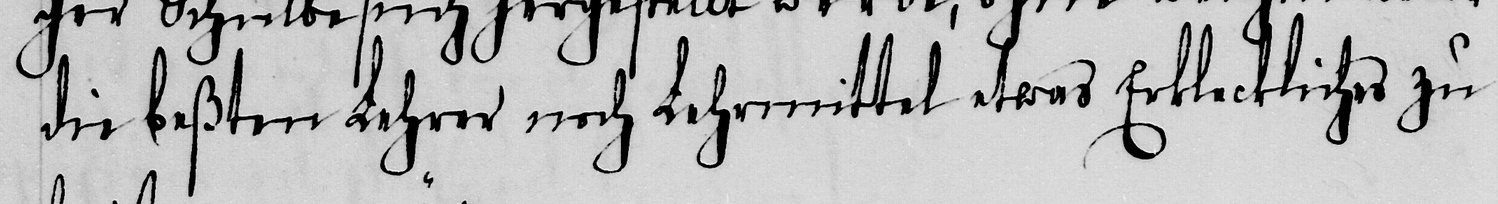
die besten Lehrer noch Lehrmittel etwas Erkleckliches zu
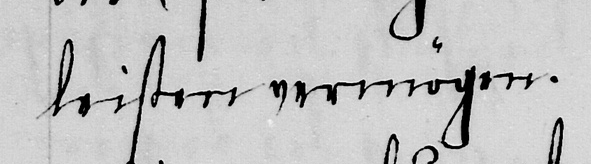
leisten vermögen.
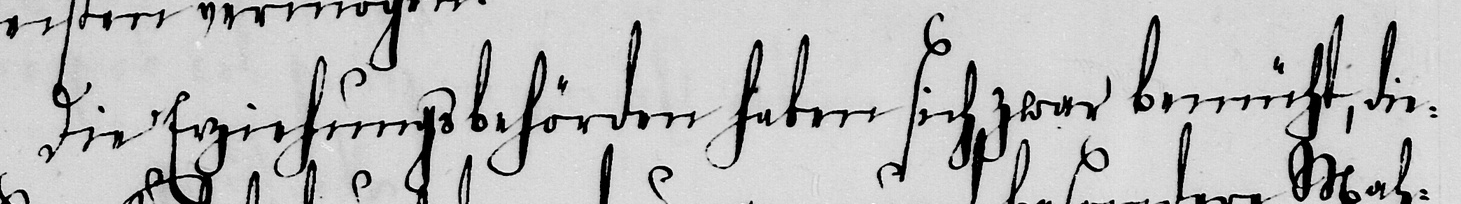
Die Erziehungsbehörden haben sich zwar bemüht, di¬
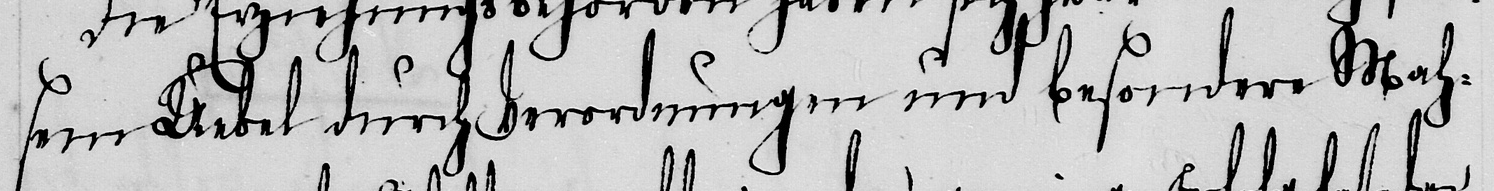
esem Uebel durch Verordnungen und besondere Mah¬
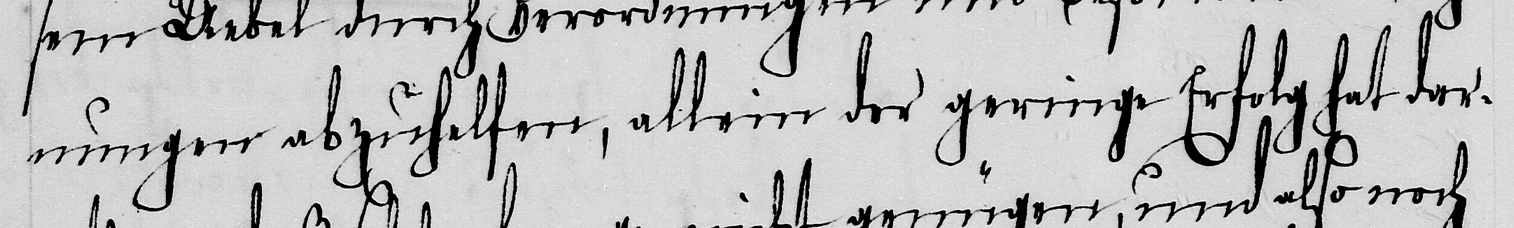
nungen abzuhelfen, allein der geringe Erfolg hat da¬
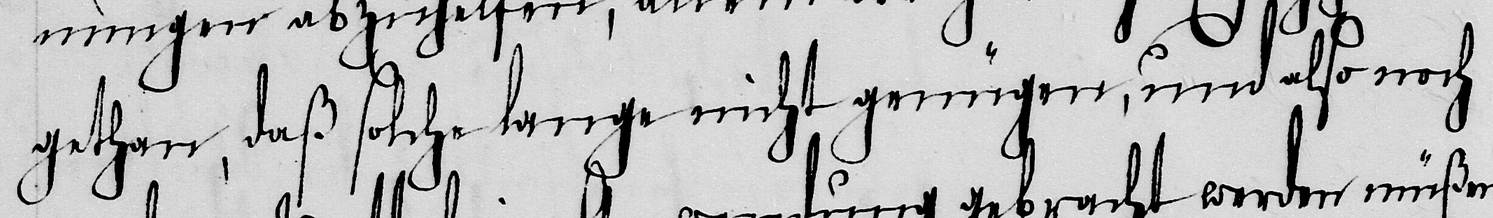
gethan, daß solche lange nicht genügen, und also noch
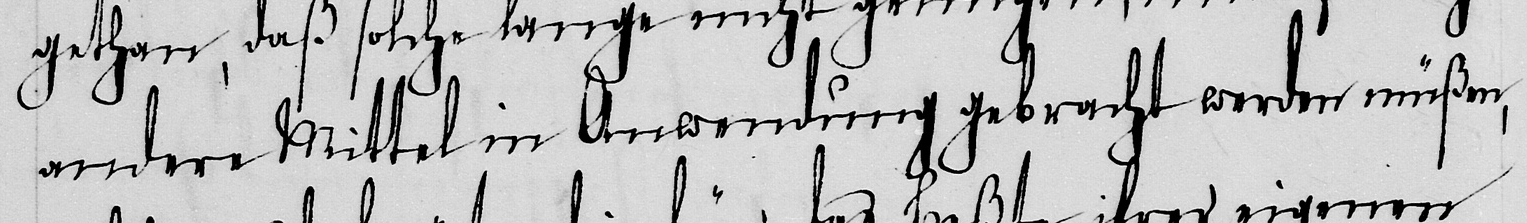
andere Mittel in Anwendung gebracht werden müßen,
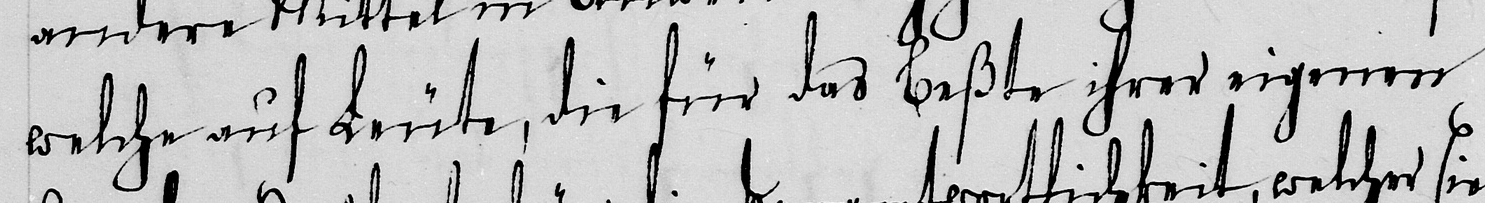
welche auf Leute, die für das Beßte ihrer eigenen
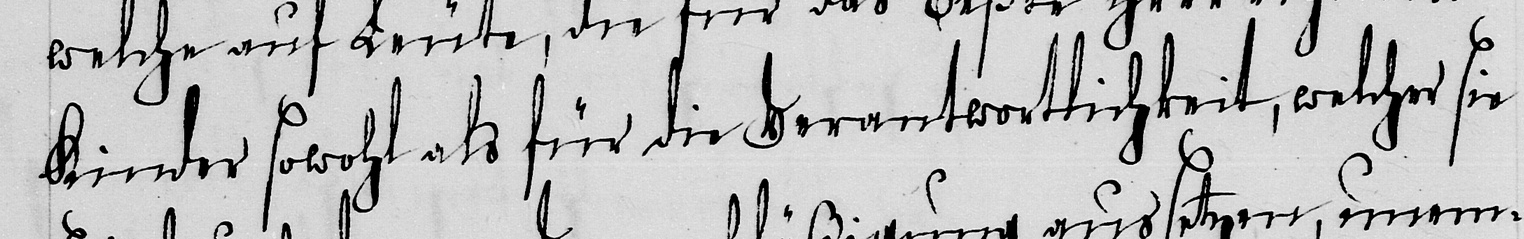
Kinder sowohl als für die Verantwortlichkeit, welcher sie
